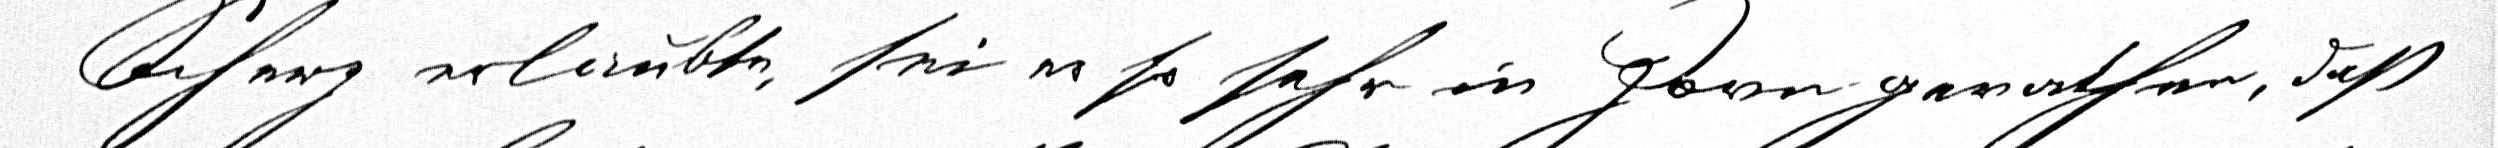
Scherz erlaubte, sei er so sehr in Zorn gerathen, daß
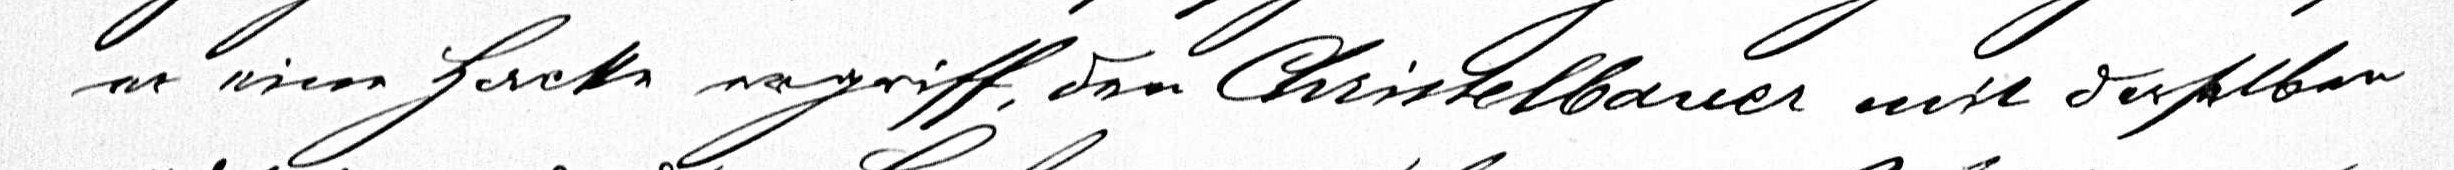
er eine Hacke ergriff, den Christelbauer mit derselben
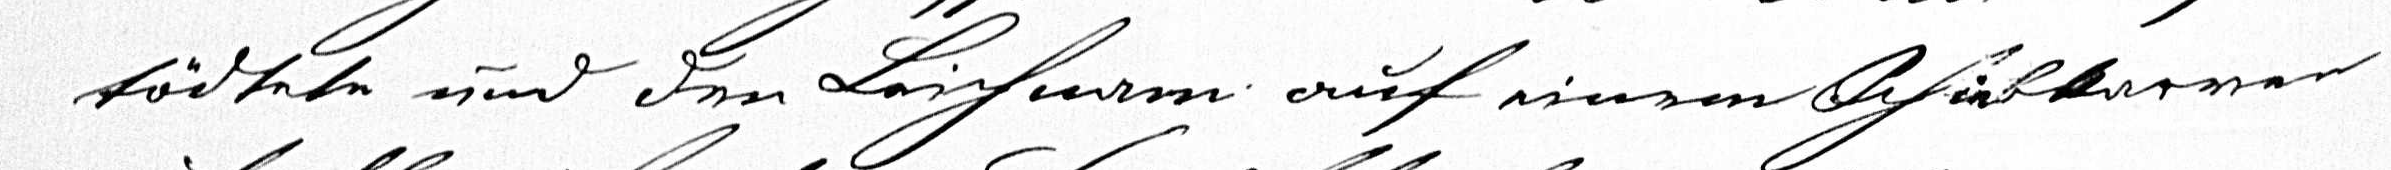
tödtete und den Leichnam auf einem Schubkarren
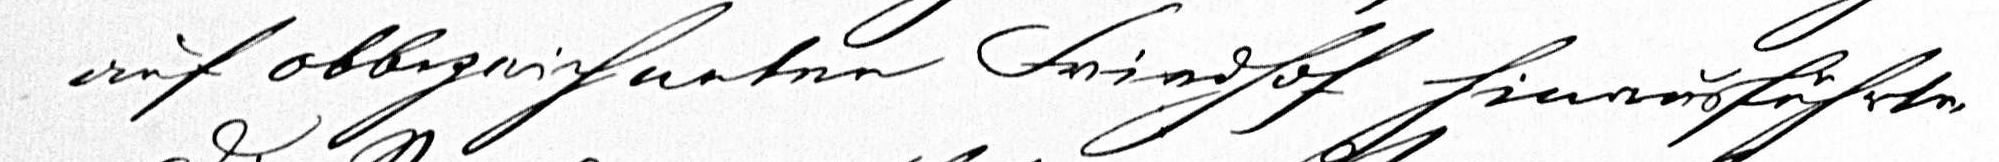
auf obbezeichneten Friedhof hierausführte.
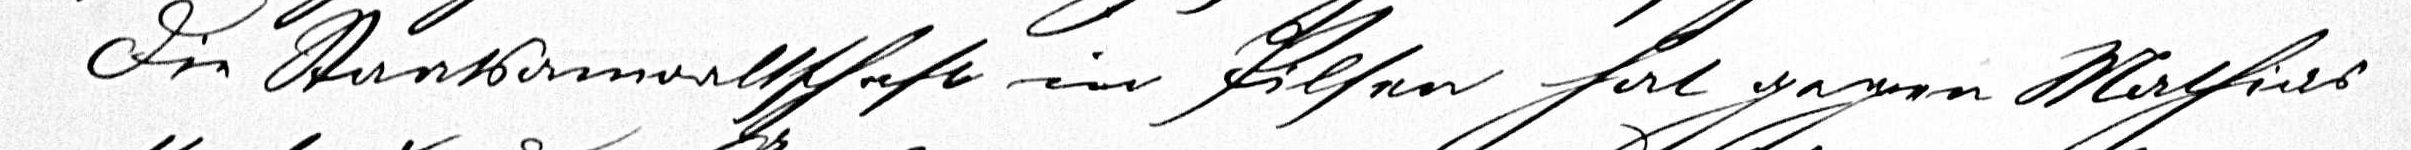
Die Staatsanwaltschaft in Pilsen hat gegen Mathias
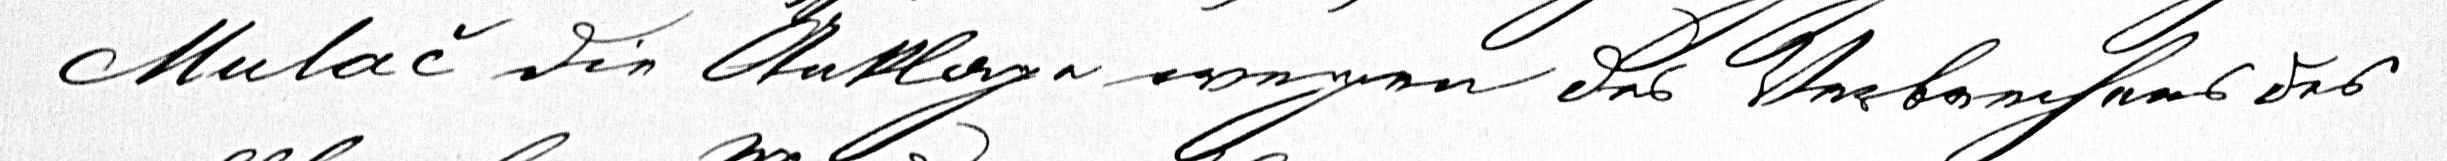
Mulač die Anklage wegen des Verbrechens des
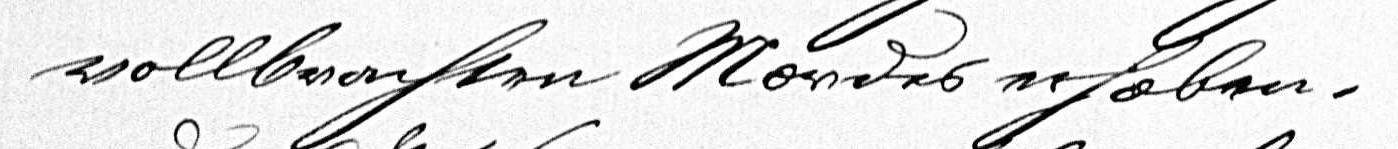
vollbrachten Mordes erhoben.
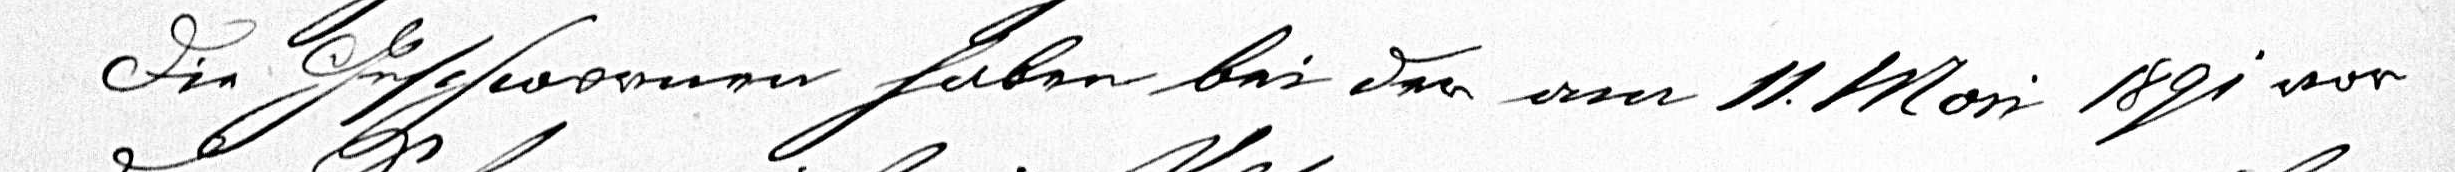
Die Geschworenen haben bei der am 11. Mai 1891 vor
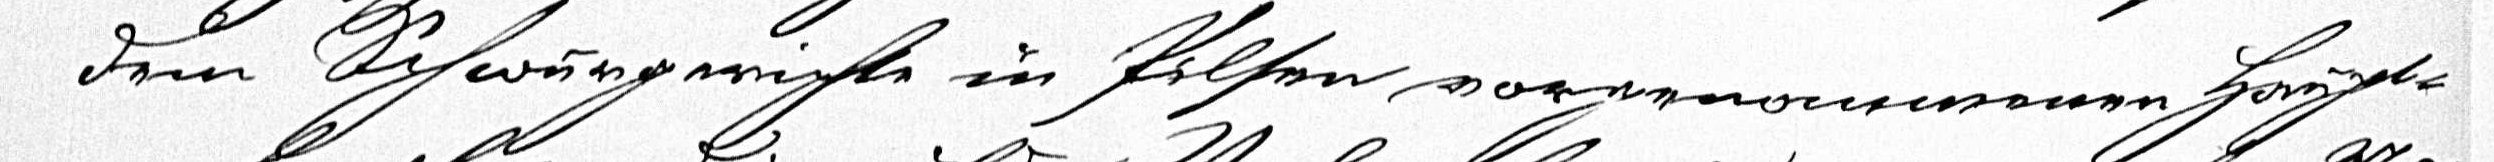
dem Schwurgerichte in Pilsen vorgenommenen Haupt¬
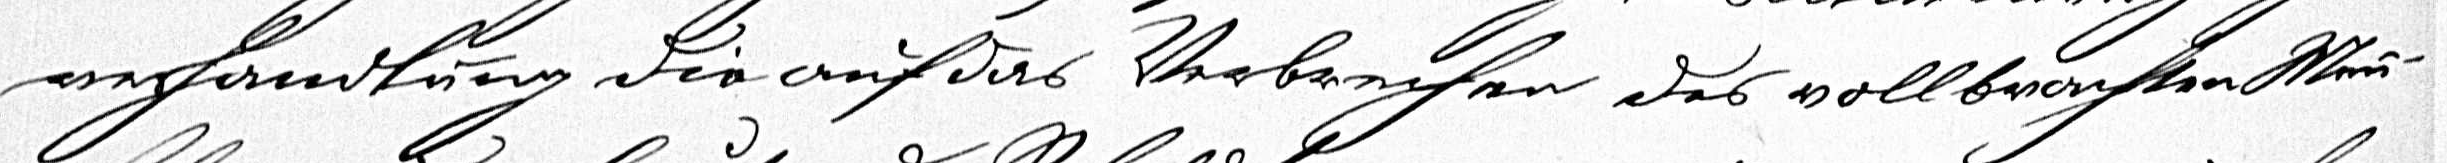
verhandlung die auf das Verbrechen des vollbrachten Meu¬
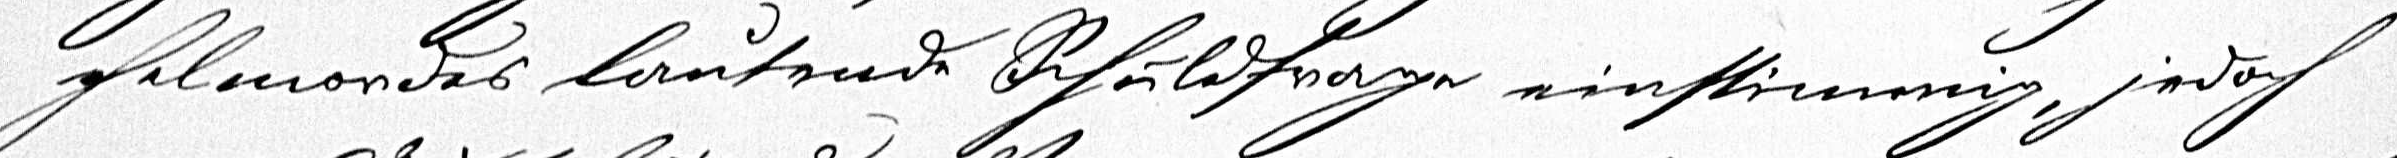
chelmordes lautende Schuldfrage einstimmig, jedoch
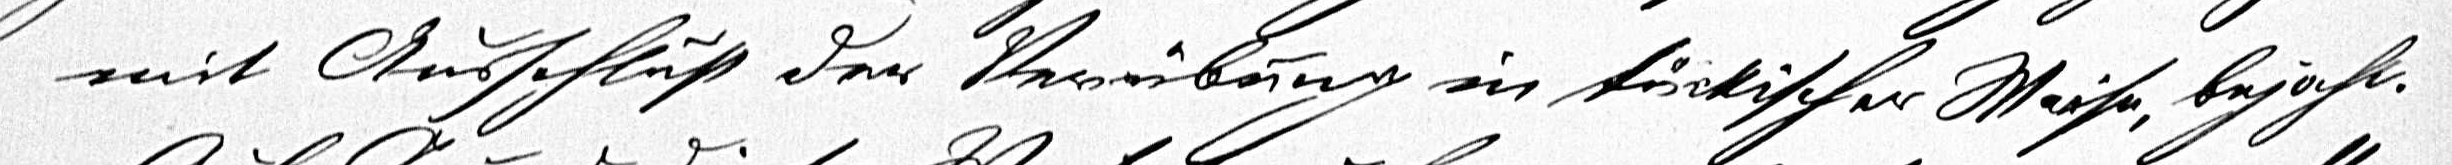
mit Ausschluß der Verübung in tückischer Weise, bejaht.
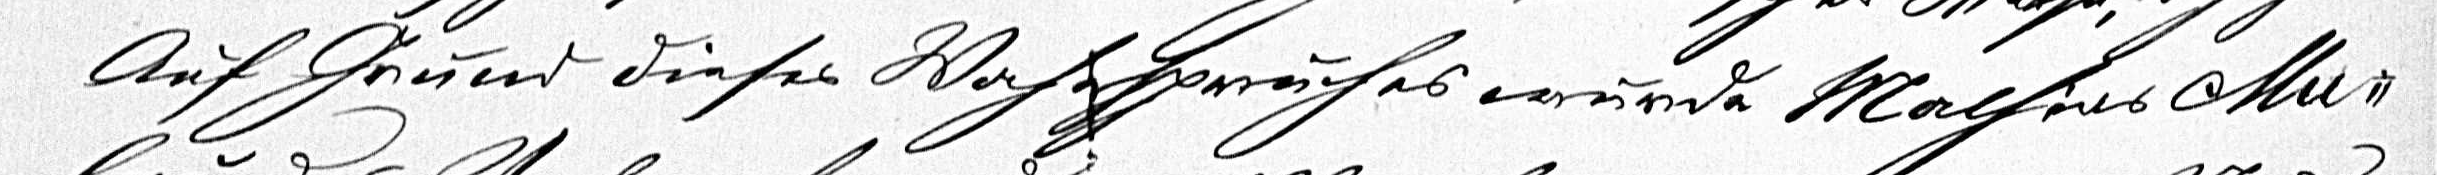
Auf Grund dieses Wahrspruches wurde Mathias Mu¬
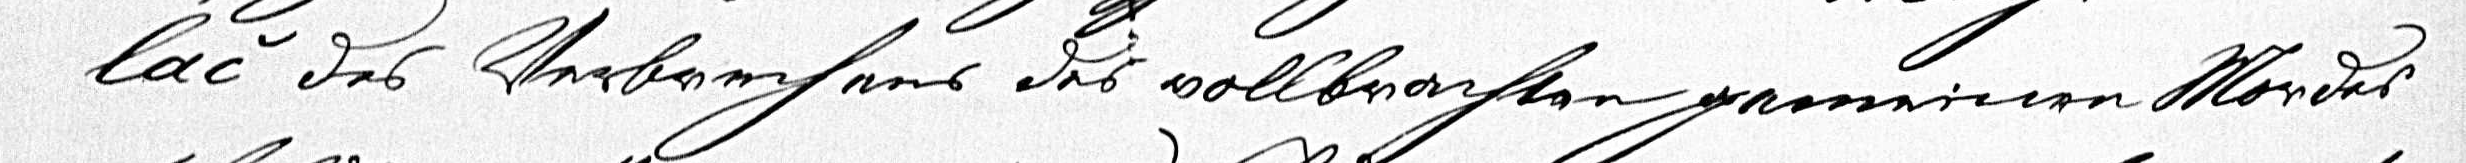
lač des Verbrechens des vollbrachten gemeinen Mordes
